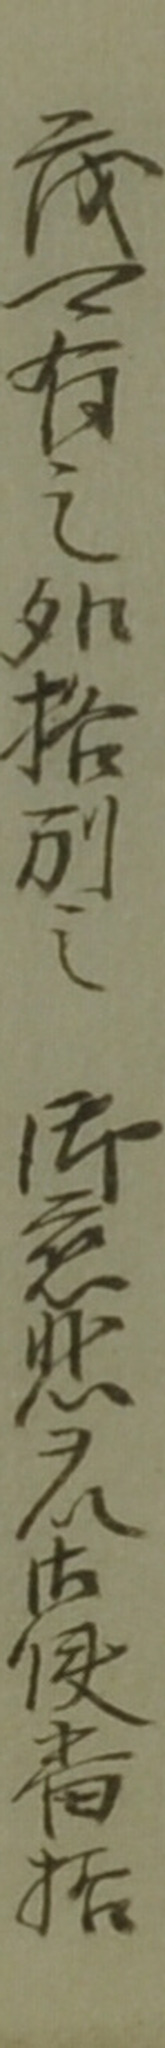茂可有之処格別之御慈悲ヲ以御使番格
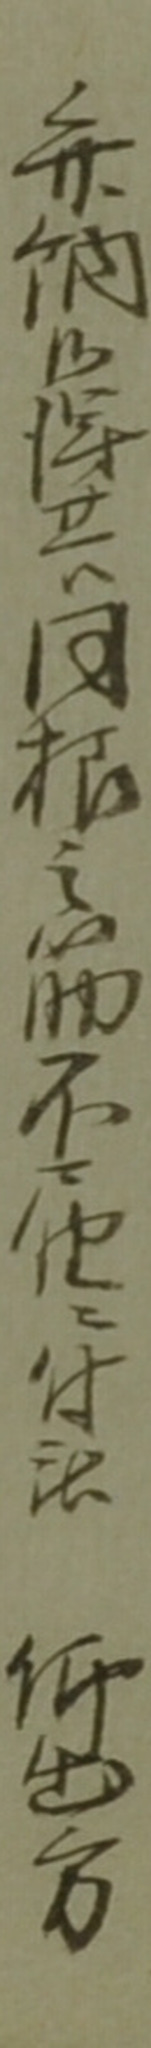弁納御共同様之筋不届ニ付被仰出方
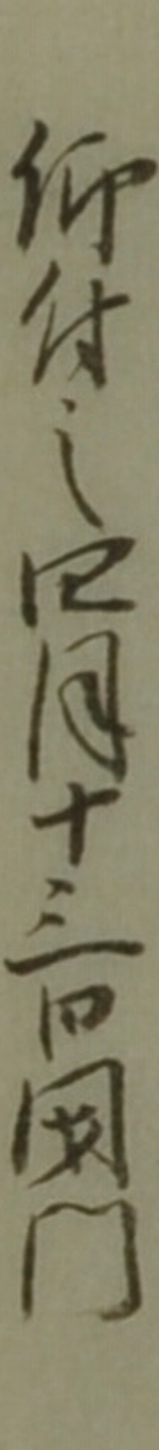仰付之四月十三日閉門
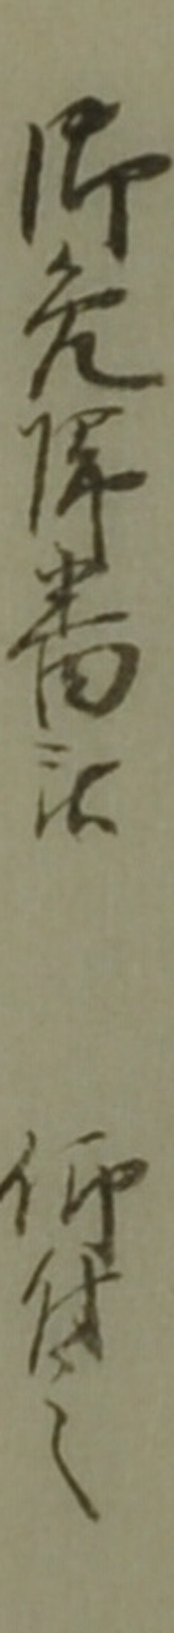御免帰番被仰付之
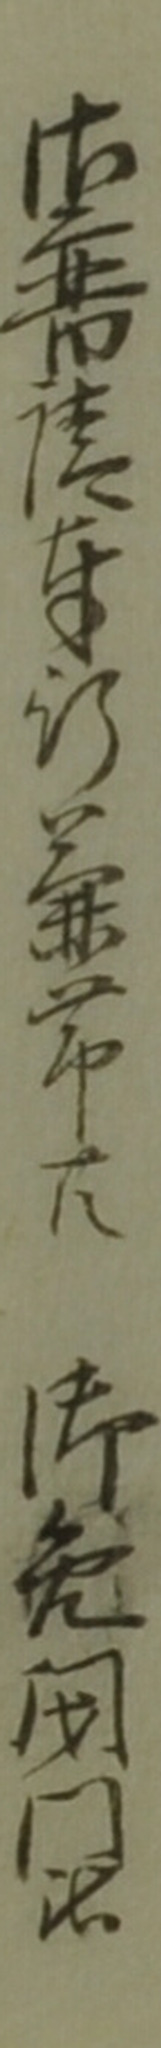御普請奉行兼帯共御免閉門被
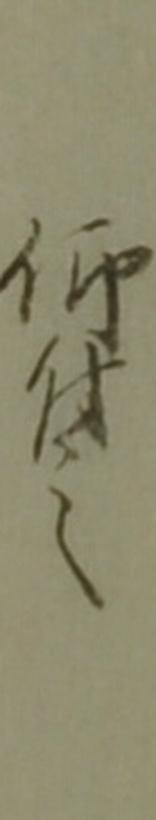仰付之
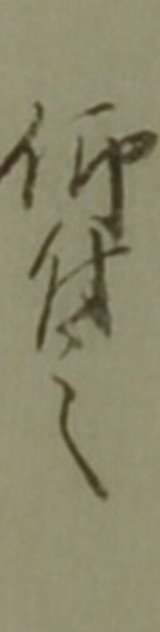仰付之
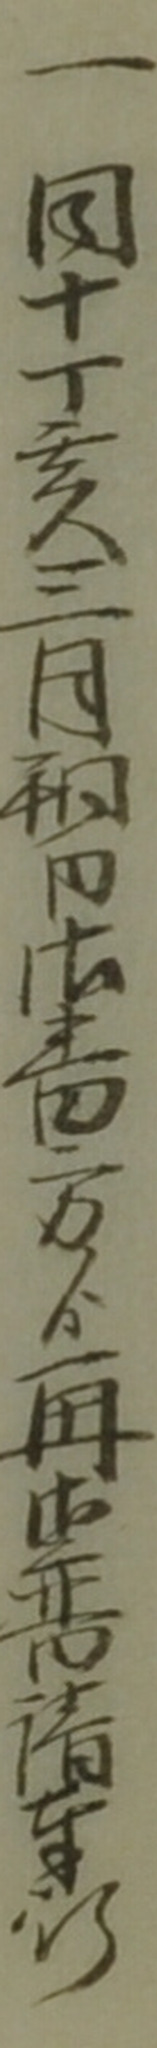一同十丁亥三月朔日御番方ゟ再御普請奉行
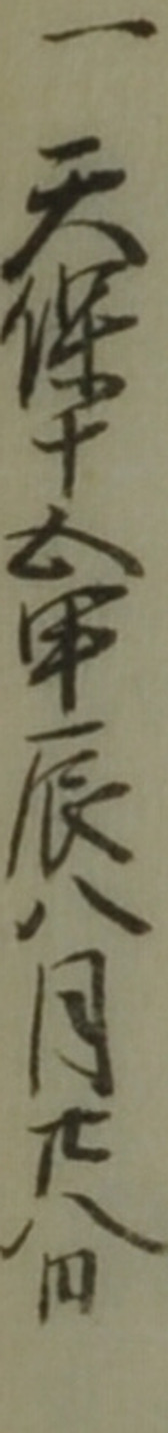一天保十五甲辰八月廿八日
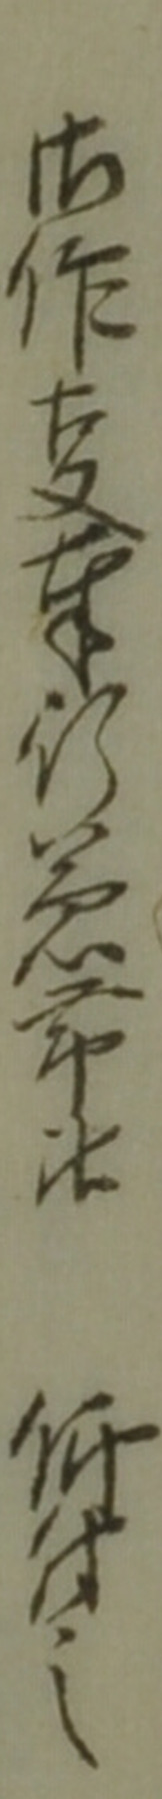御作事奉行兼帯被仰付之
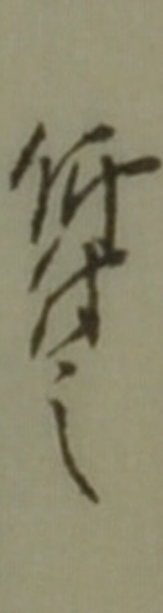仰付之
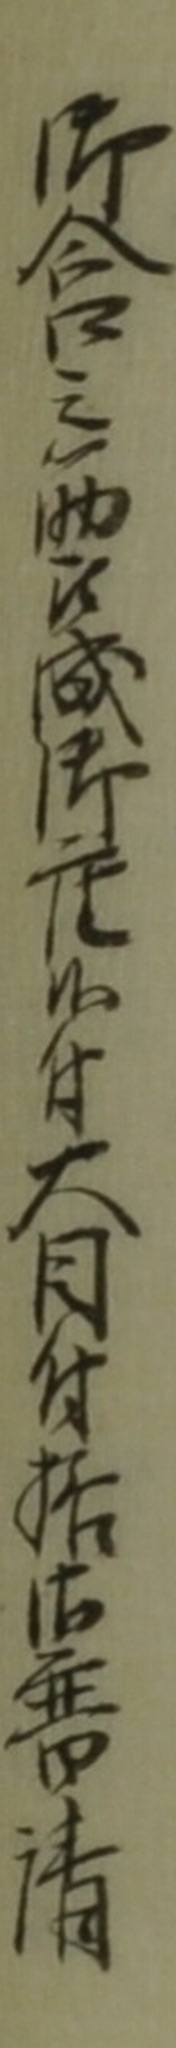御含之筋被成御座候付大目付格御普請
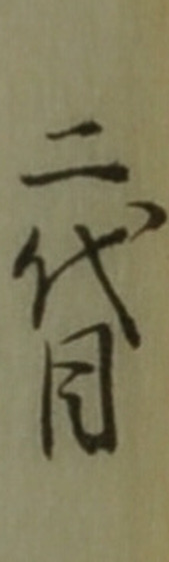二代目
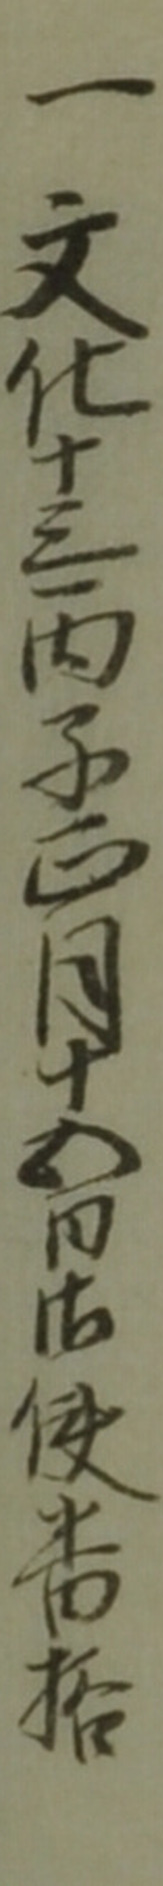一文化十三丙子正月十五日御使番格
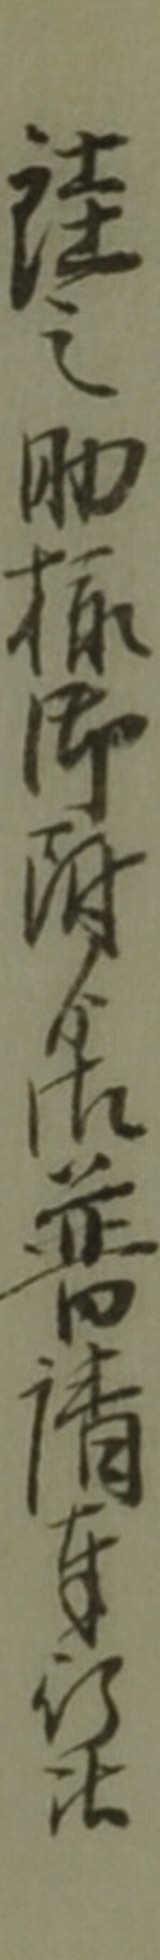銈之助様御附ゟ御普請奉行被
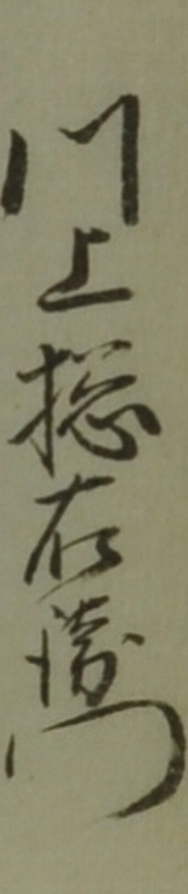川上捴右衛門
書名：諸御役代々録（六）
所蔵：伊那市立高遠町図書館・合同会社AMANE
